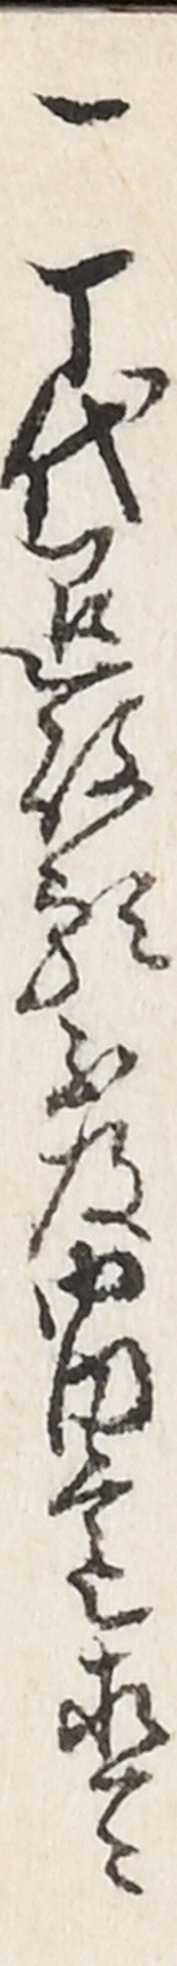一丁代退役願不及御内意直ニ
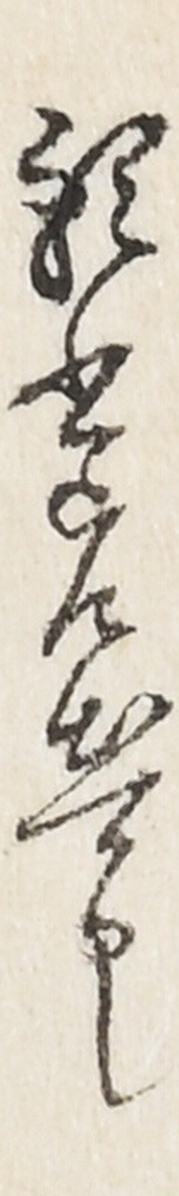願書差出可申候
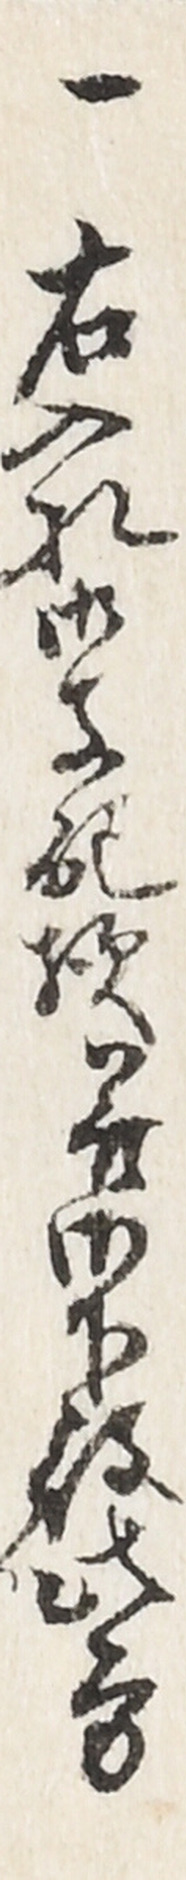一右入札御支配様并御下役此方
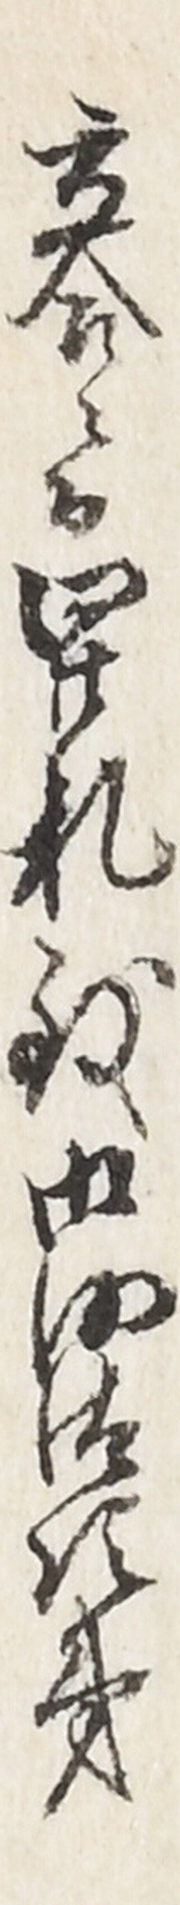立合ニ而開札致御沙汰次第
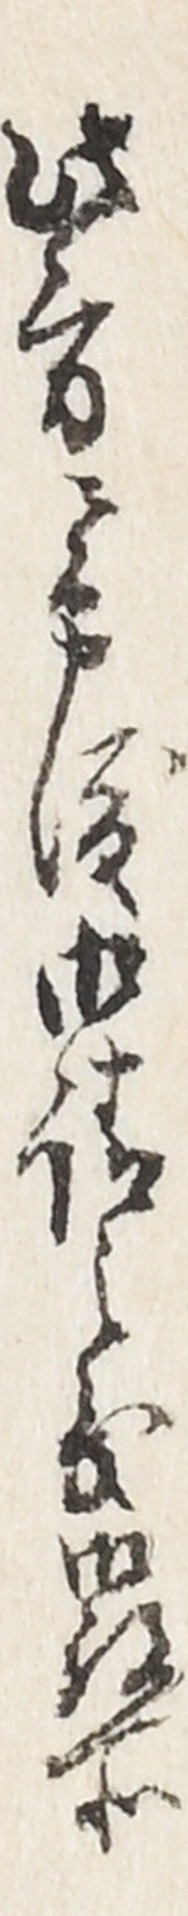此方ニ而申渡御請之義御役所
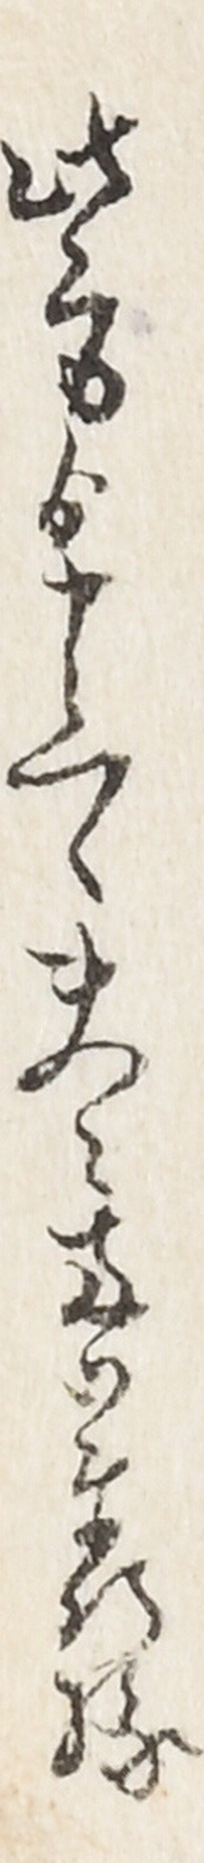此方より申上候は夫々両御奉行様
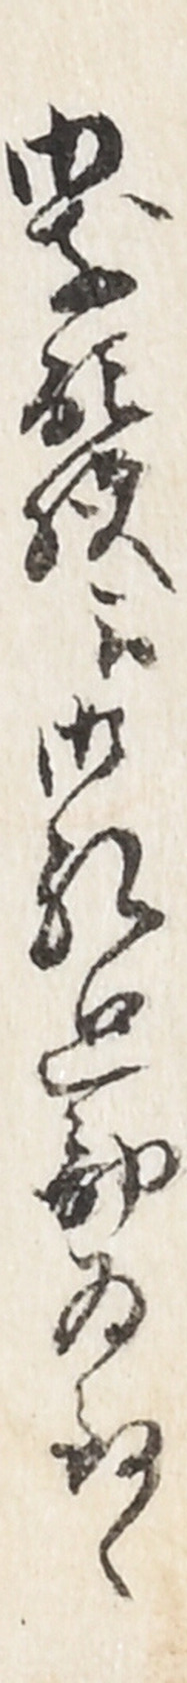御支配様江御礼廻勤為致候
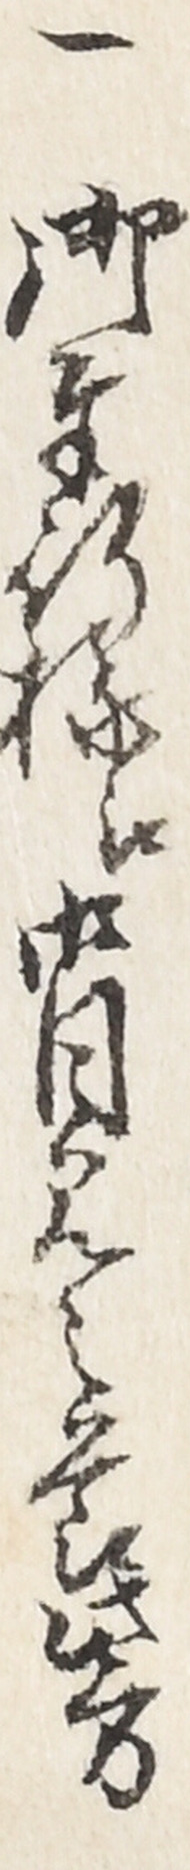一御奉行様江御目見之節此方
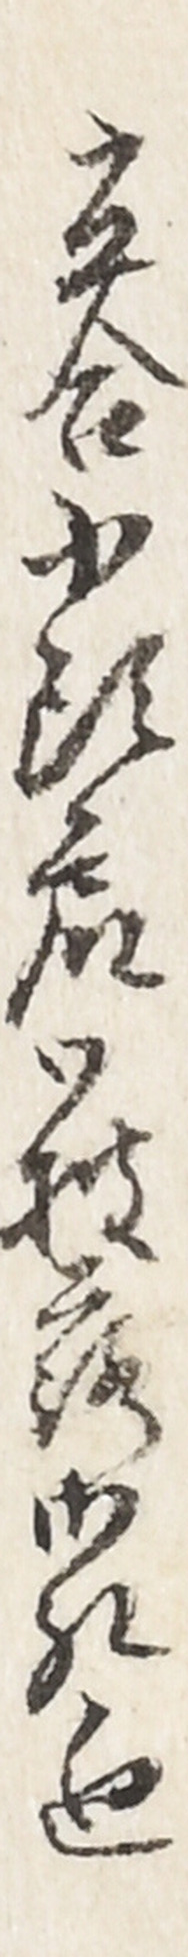立合小頭衆御披露御礼包
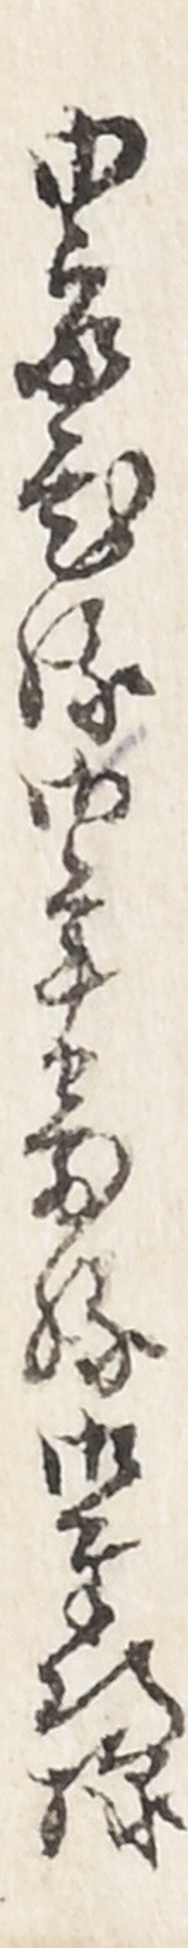御家老様御年寄様御奉行様
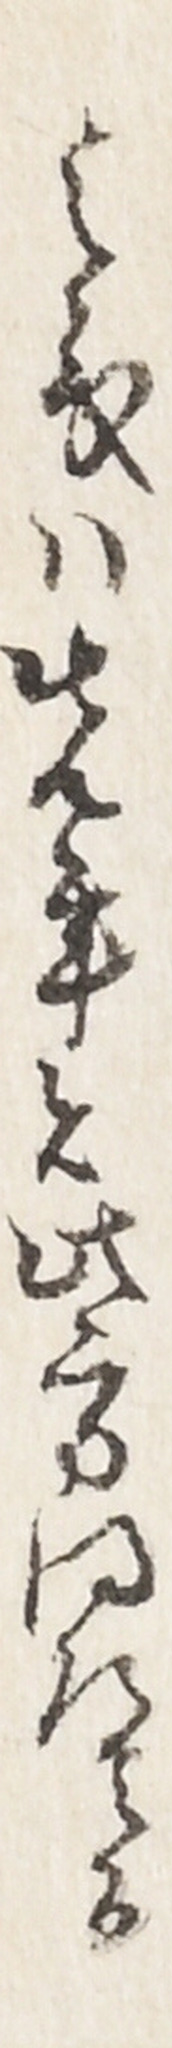之義は先年は此方同道ニ而
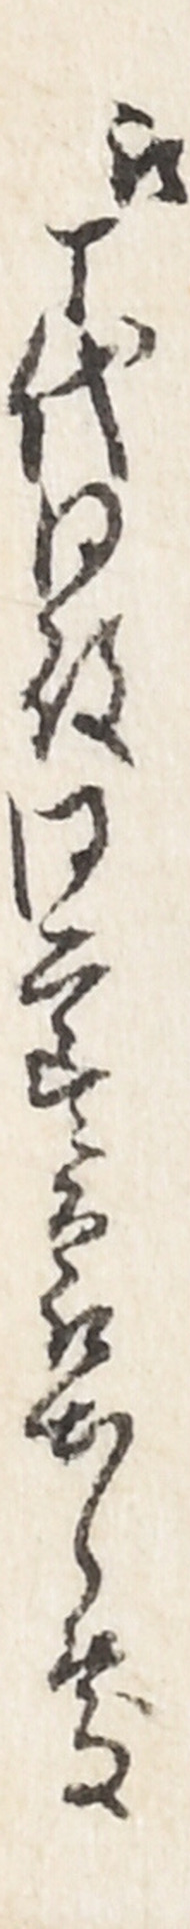被丁代同役同ニ而取出候処
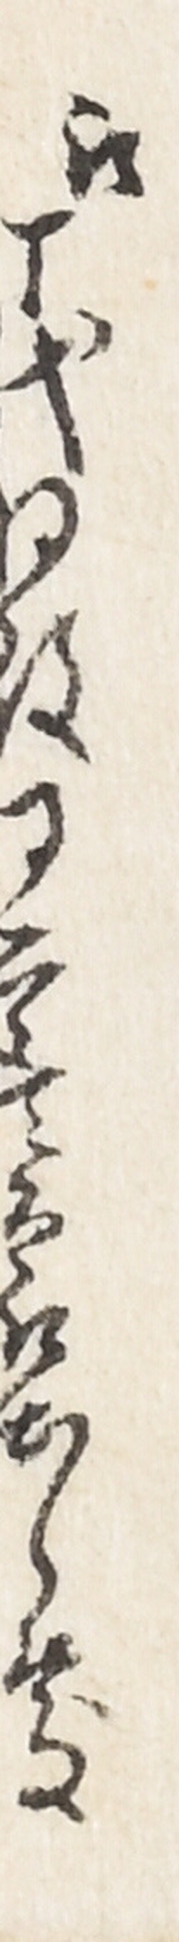被丁代同役同ニ而取出候処

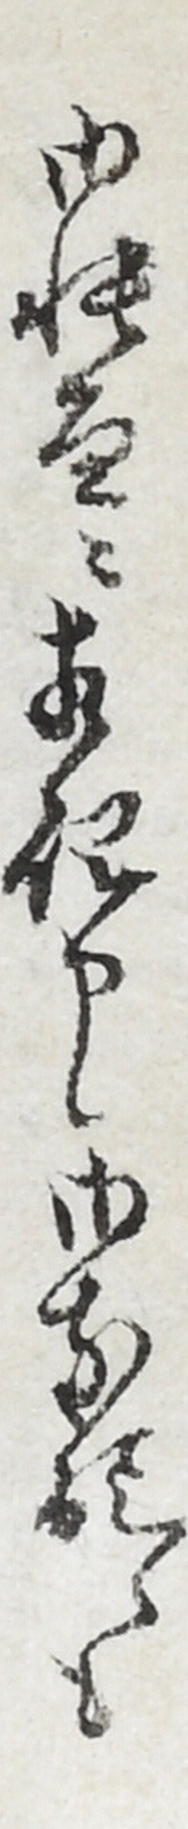御帳面ニ相触申候御支配へも
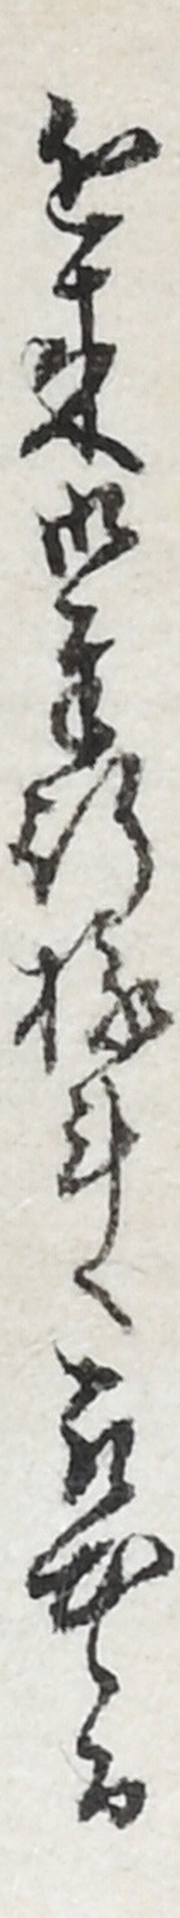近来御奉行様計へ罷出候而
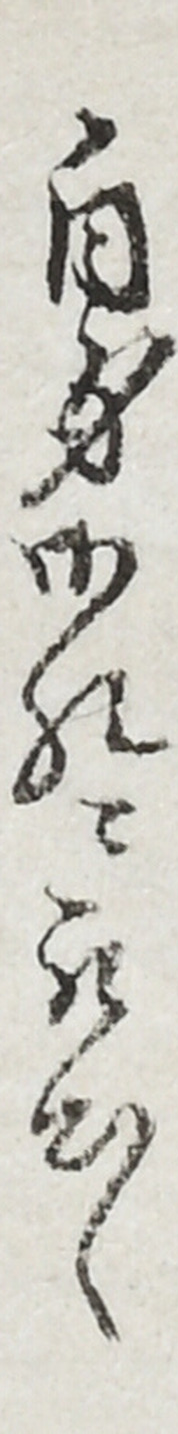自身御礼ニ被出候
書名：年内行事懐中録
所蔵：伊那市立高遠町図書館・合同会社AMANE
